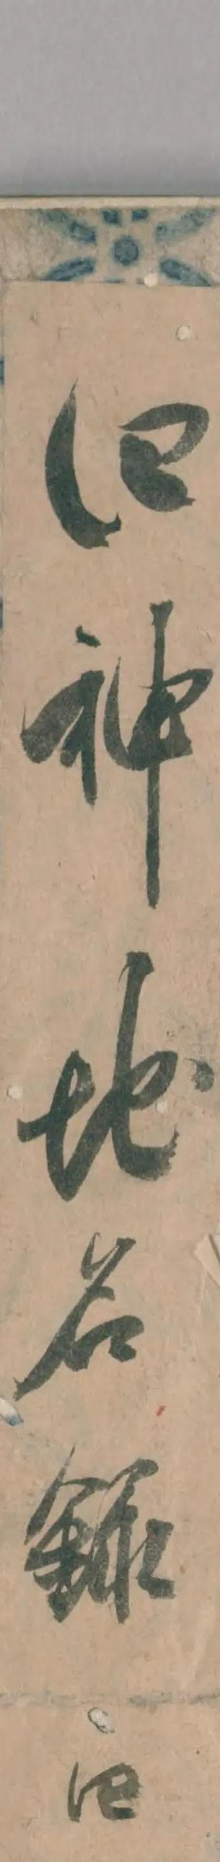四神地名録四

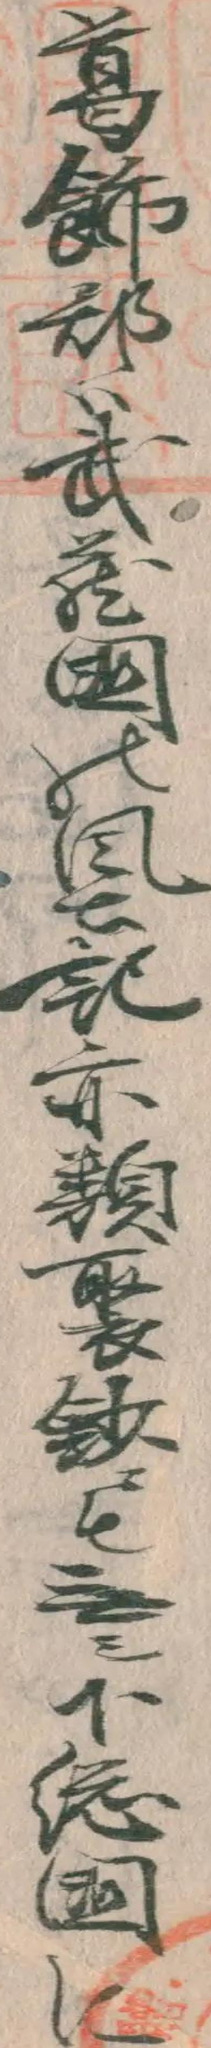葛飾郡は武蔵国の風土記亦類聚鈔にも無し下総国に
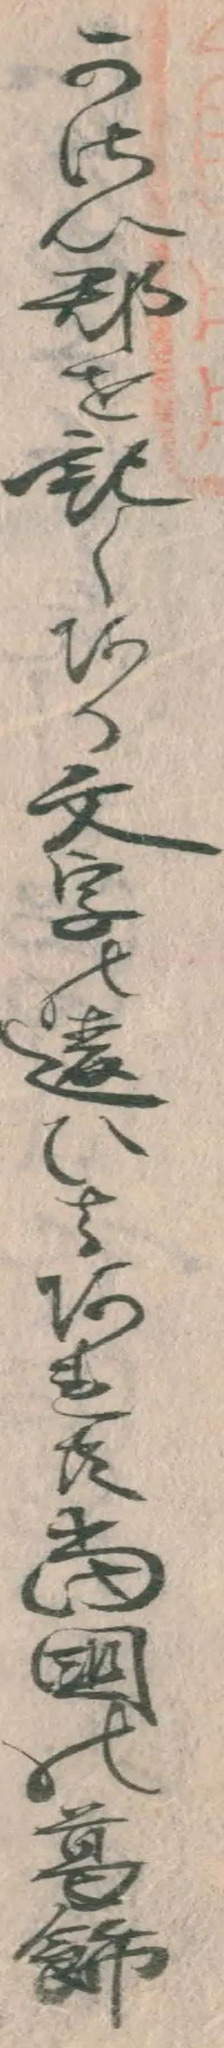かさい郡を記しあり文字の違ひはあれ共当国の葛飾
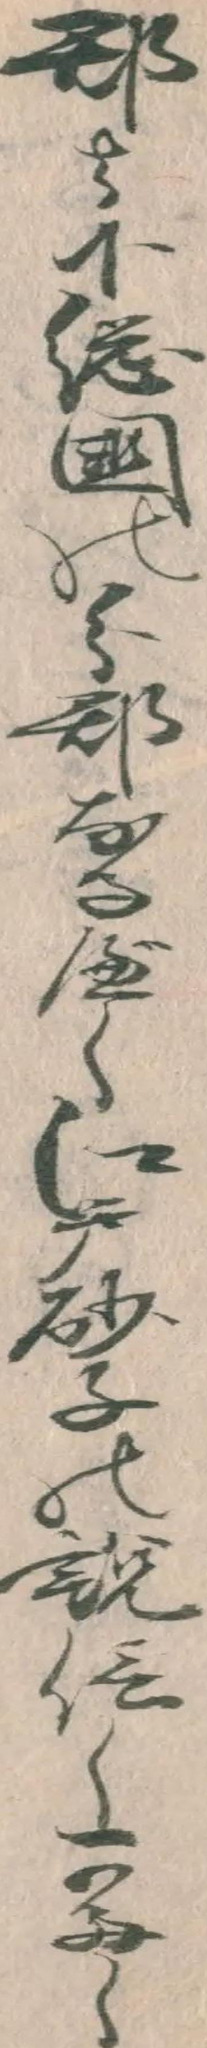郡は下総国の分郡なるべく江戸砂子の説信しかたし
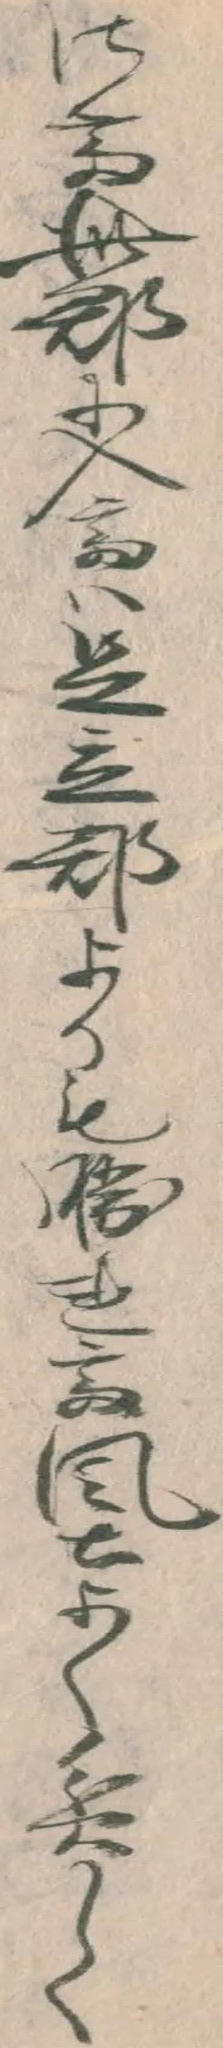さて此郡に入ては足立郡よりも勝れて風土よく貧しく
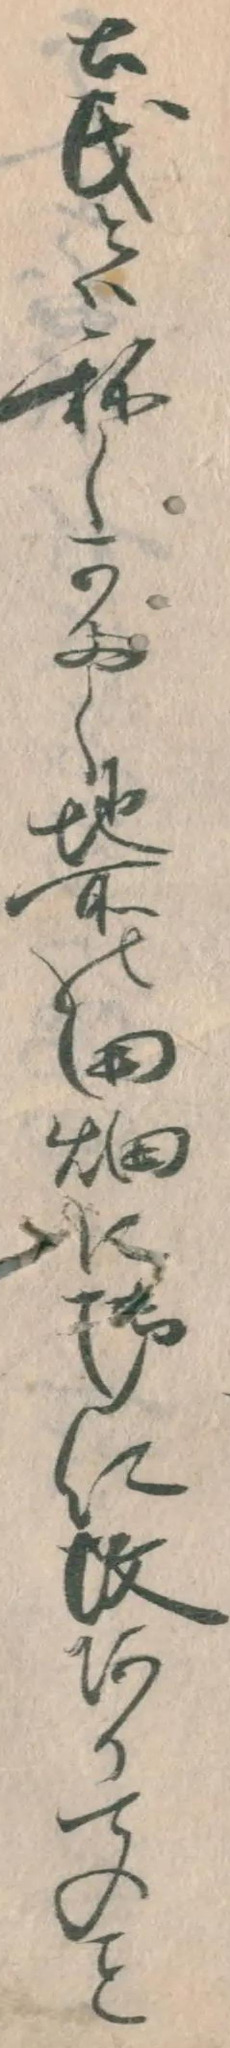土民とは称しかたし地所の田畑に御仁政ありてのこと
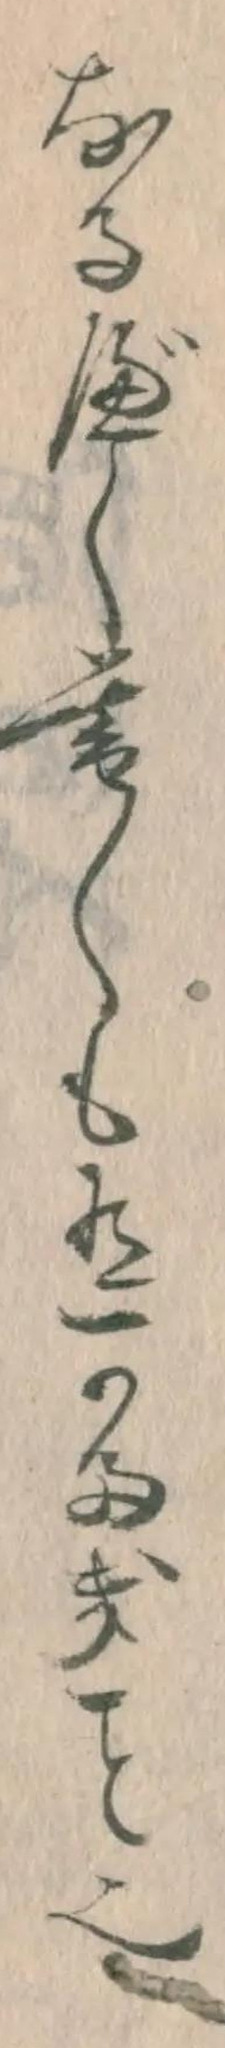なるべし暮〳〵も有かたきこと也

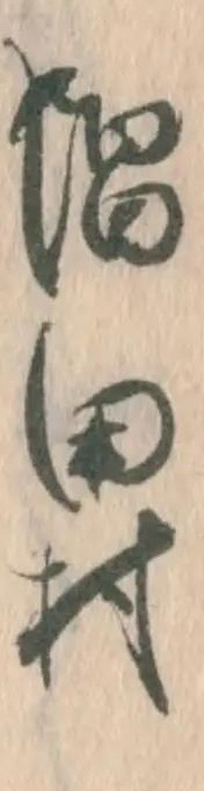隅田村
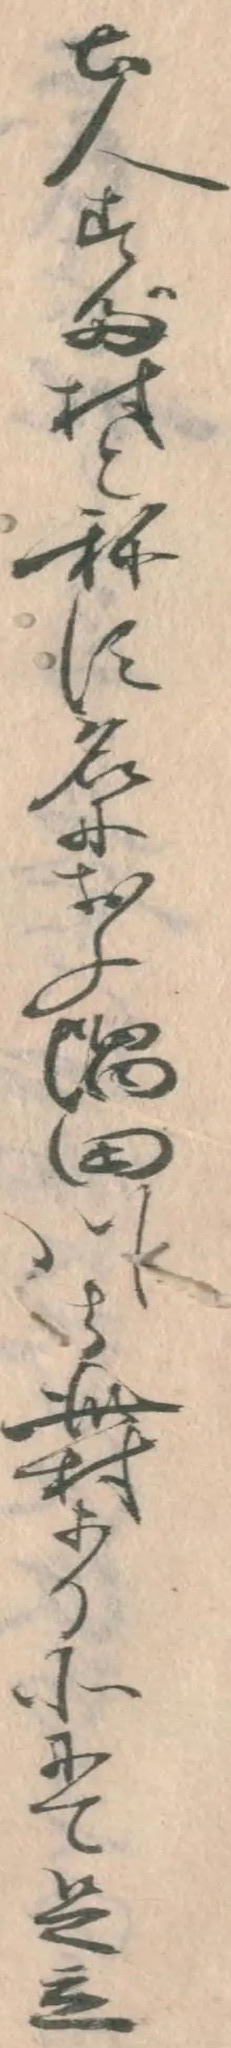土人すま村と称す名におふ隅田川は此村より北にて足立
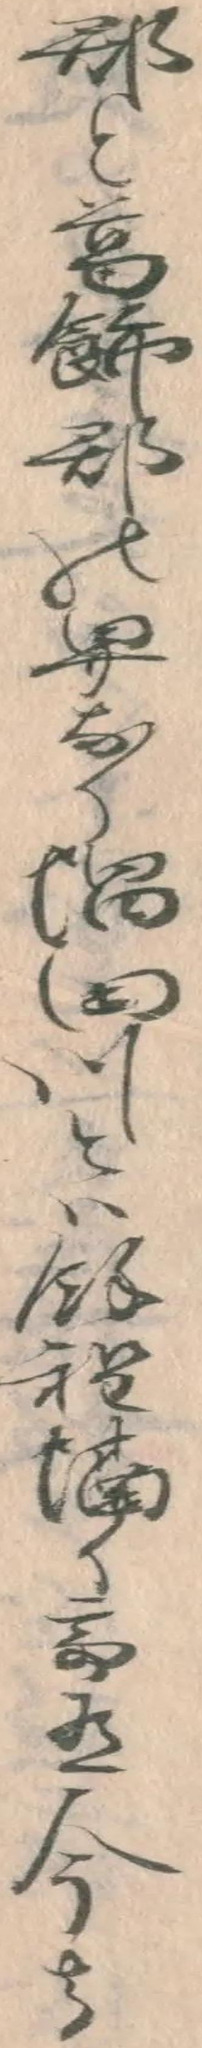郡と葛飾郡の堺なり隅田川とは余程隔りて有今は
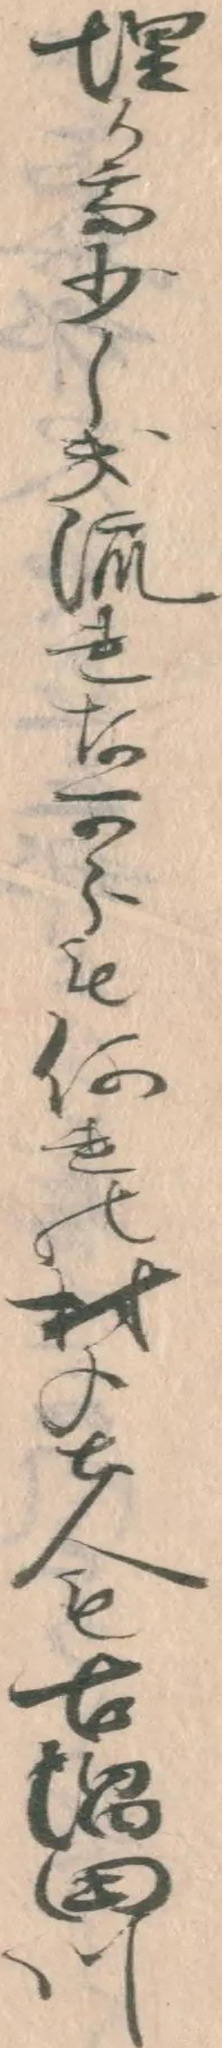埋りて少しき流れなからも何れの村の土人も古隅田川
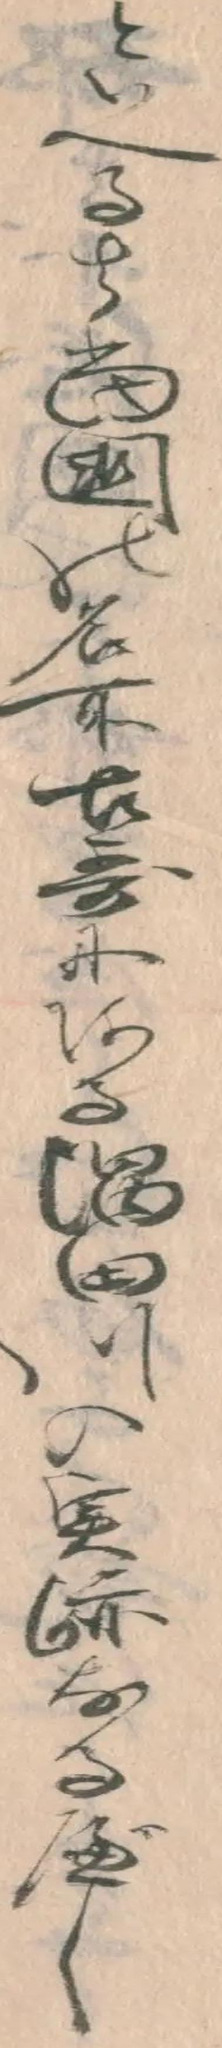といへるは当国の名所古哥のある隅田川の実跡なるべし
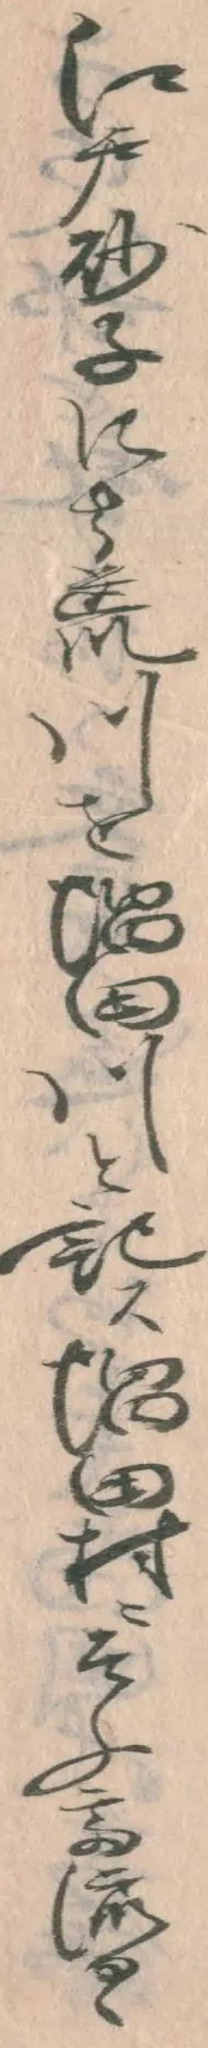江戸砂子には荒川を隅田川と記す隅田村ニそふて流るゝ
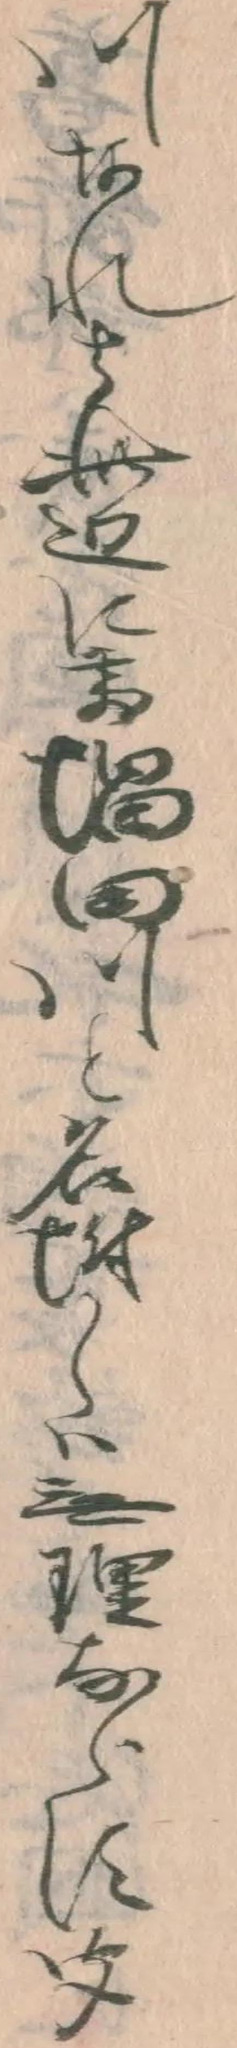川なれは此辺にて隅田川之名附しは無理ならす聞
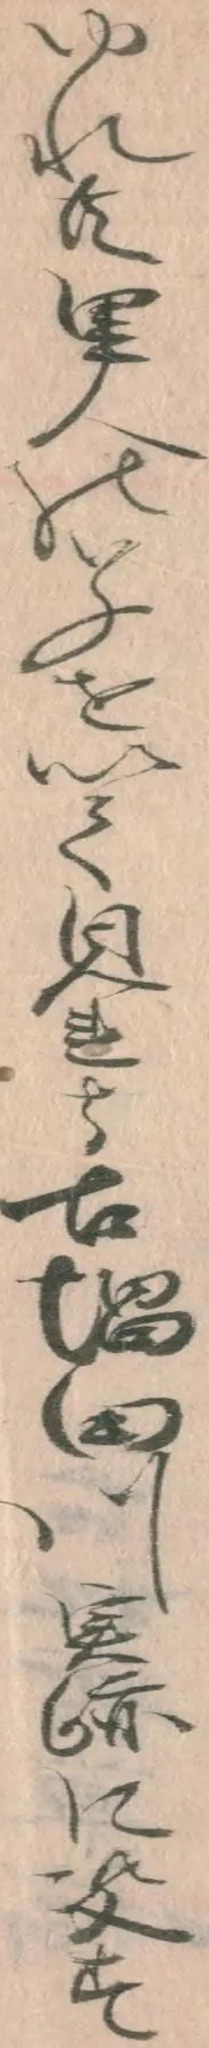ゆれ共里人のいふを以て見れて古隅田川実跡に決す
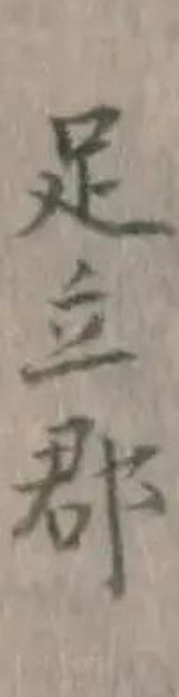足立郡
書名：四神地名録 6巻. [4]葛飾郡
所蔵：国立国会図書館 National Diet Library, JAPAN
